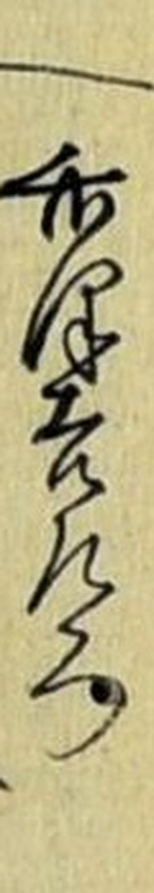竹沢吉左衛門
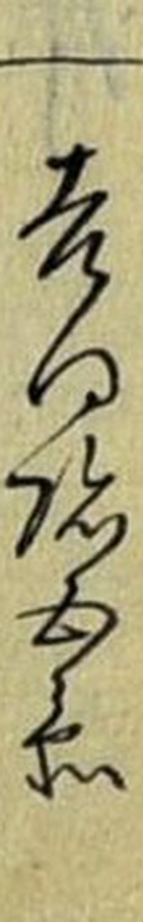吉田治五兵衛
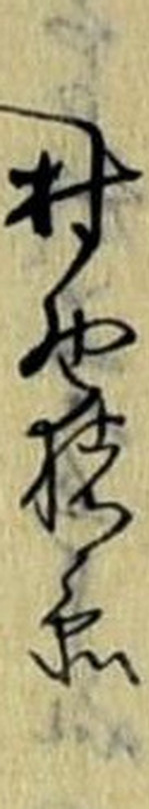村野猪兵衛
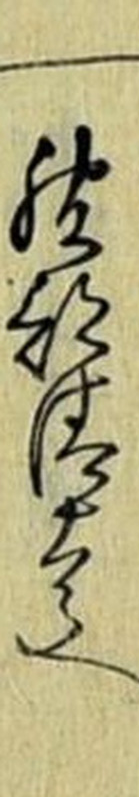服部清太夫
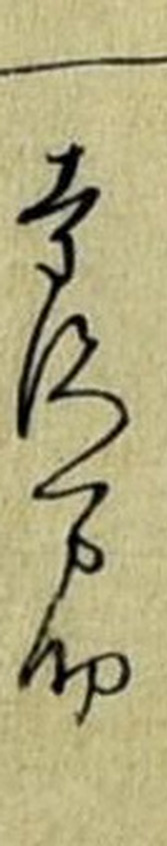寺沢万助
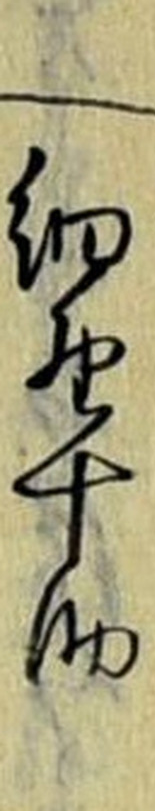細野十助
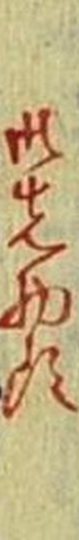御先物頭
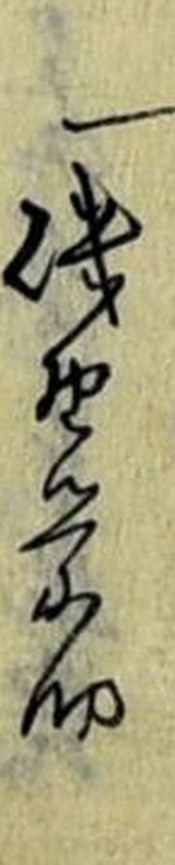磯野栄助
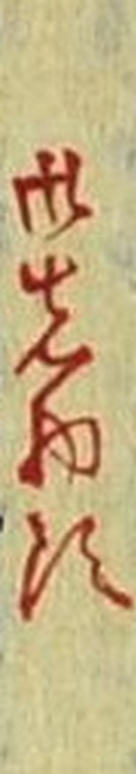御先物頭
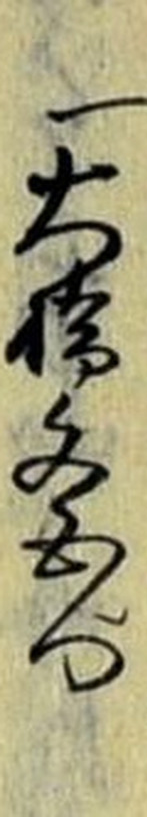大橋文五右衛門
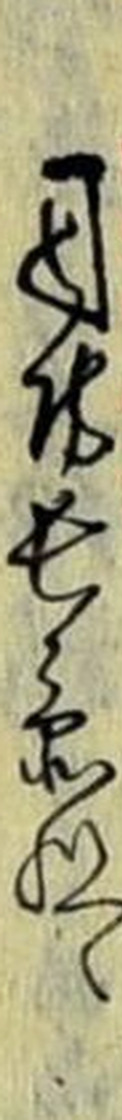周防長兵衛組へ
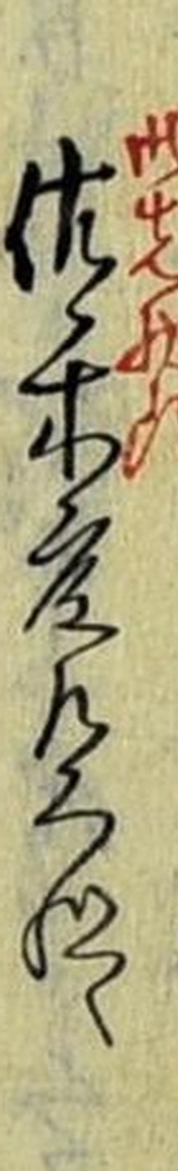佐々木藤左衛門組へ
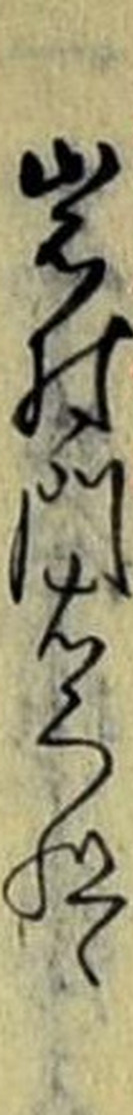岩村門右衛門組へ
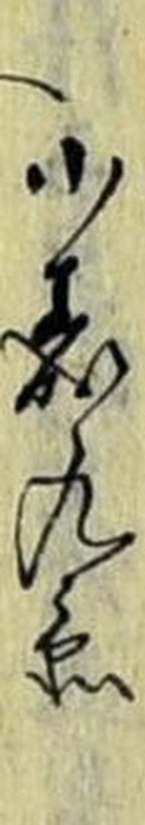小森九兵衛
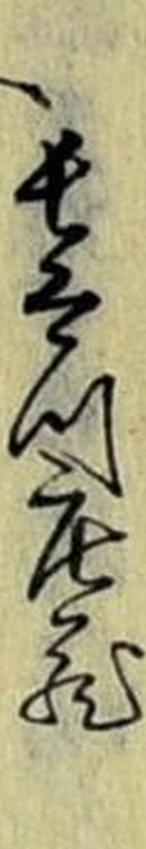長谷川庄蔵
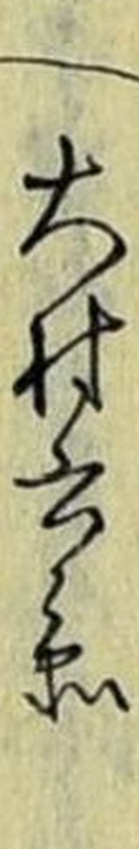大村六兵衛
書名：命令之部 四
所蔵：福井県文書館 Fukui Prefectural Archives
